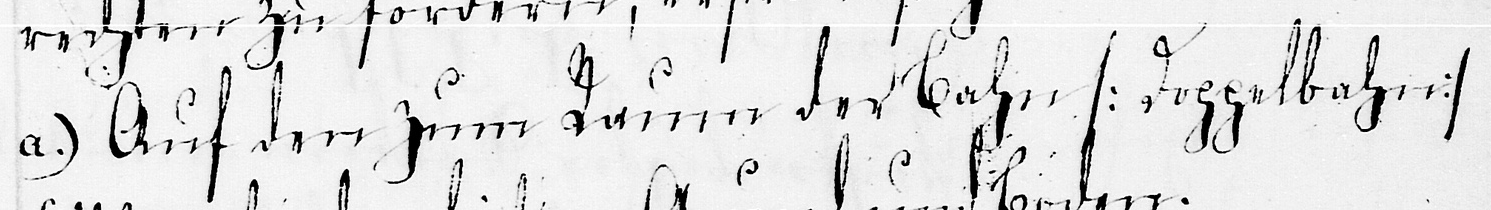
a.) Auf den zum Raum der Bahn [Doppelbahn]
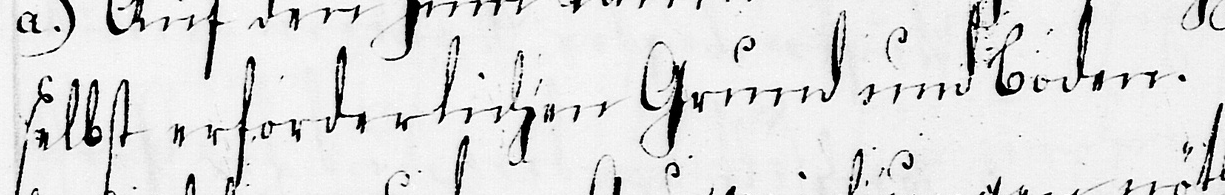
selbst erforderlichen Grund und Boden.
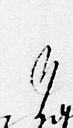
t,
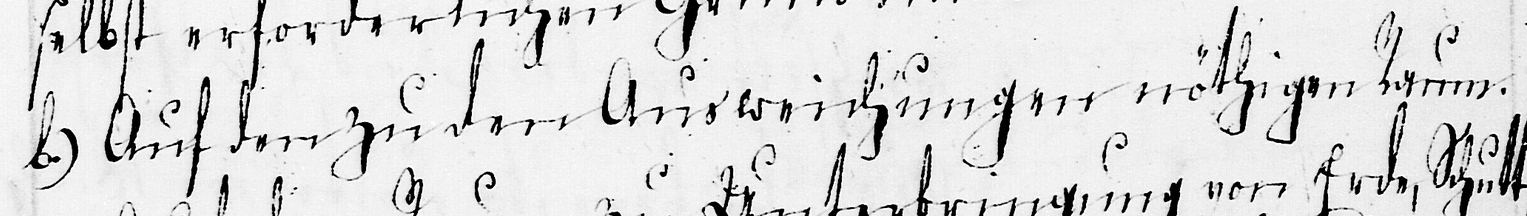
b.) Auf den zu den Ausweichungen nöthigen Raum.
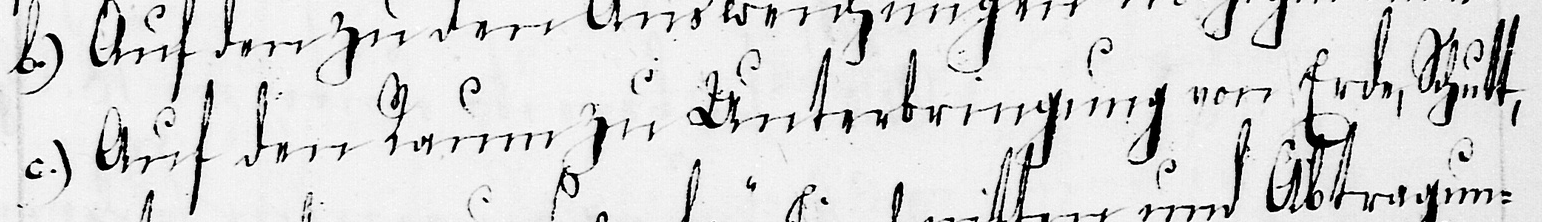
c.) Auf den Raum zu Unterbringung von Erde, Schut¬
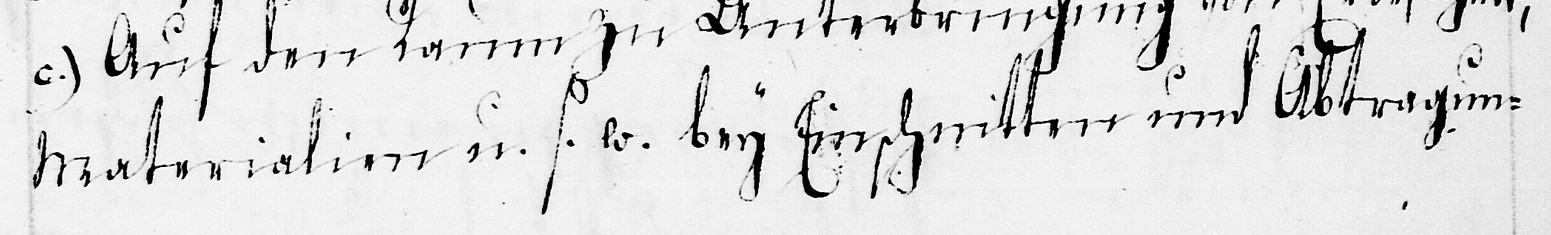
Materialien u. s. w. bey Einschnitten und Abtragun¬
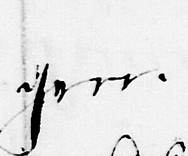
gen.
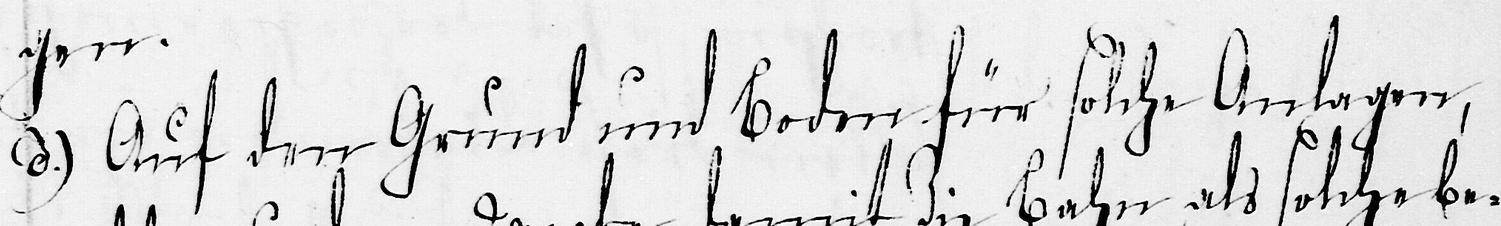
d.) Auf den Grund und Boden für solche Anlagen,
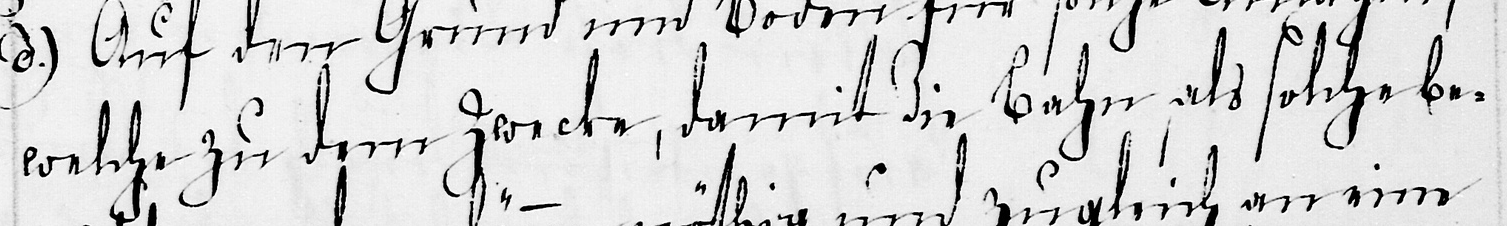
welche zu dem Zwecke, damit die Bahn als solche be¬
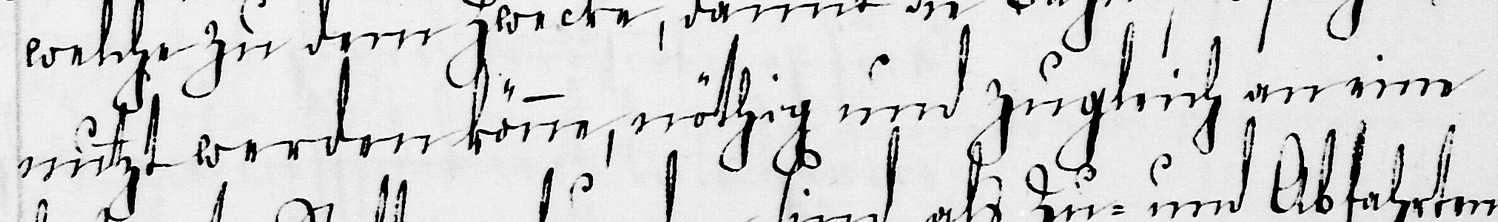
nutzt werden könne, nöthig und zugleich an eine
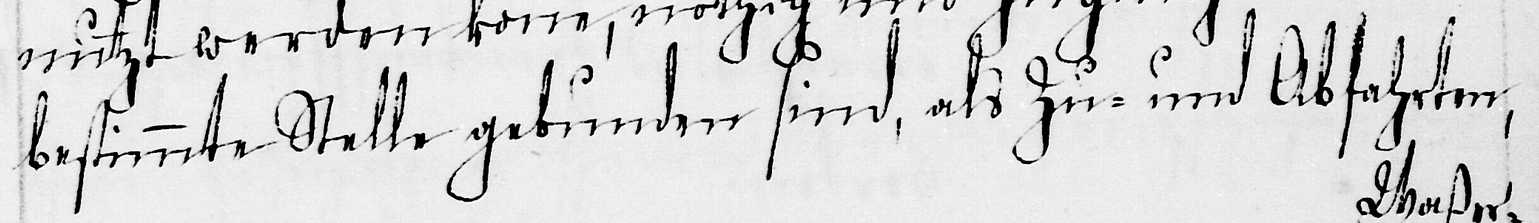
bestimmte Stelle gebunden sind, als Zu- und Abfahrten,
